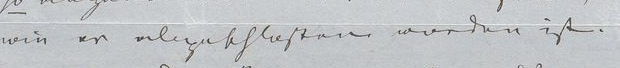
wie er abgeschloßen worden ist. –
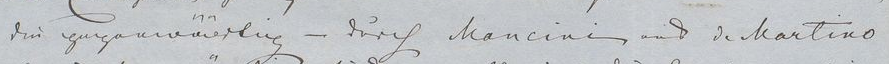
die gegenwärtig, durch Mancini und de Martino
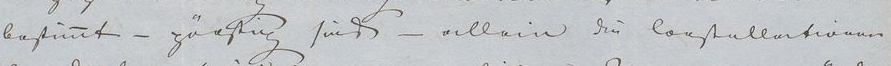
bestimmt, günstig sind, allein die Constellationen
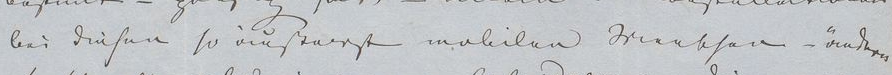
bei desen so äußerst mobilen Menschen, ändern
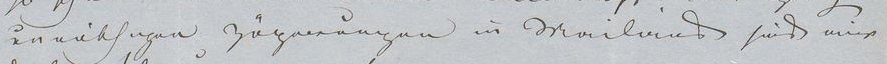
unnöthigen Zögerungen in Mailand sind mir
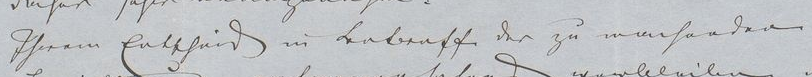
Ihrem Entscheid in Betreff der zu machenden
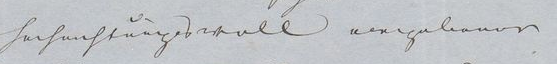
hochachtungsvoll ergebener
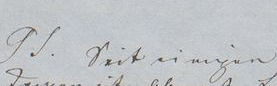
PS. Seit einigen
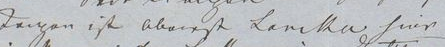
Tagen ist Oberst Lanika hier
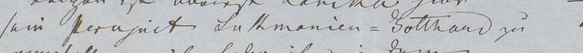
sein Project Lukmanier-Gotthard zu
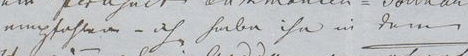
empfehlen, ich habe ihn in dem
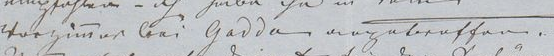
Vorzimmer bei Gadda angetroffen. –
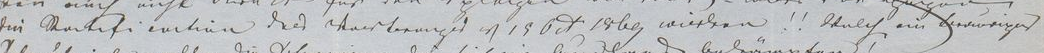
die Ratification des Vertrags v 15 Oct 1869 wirken!! Welch ein trauriges
